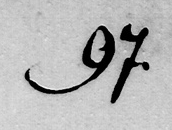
30.
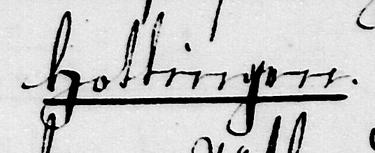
Hottingen.
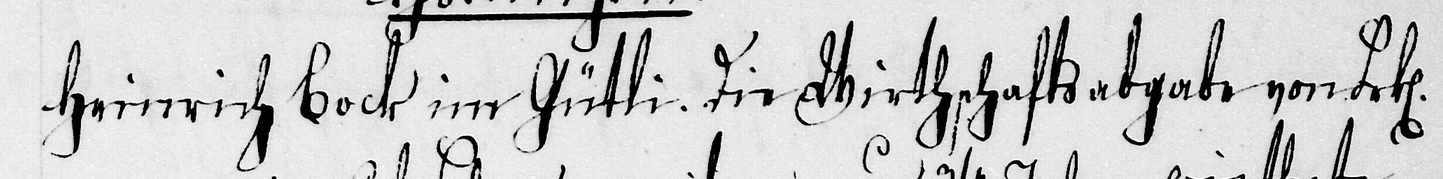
Heinrich Bock im Gütli. Die Wirthschaftsabgabe von Fr¬
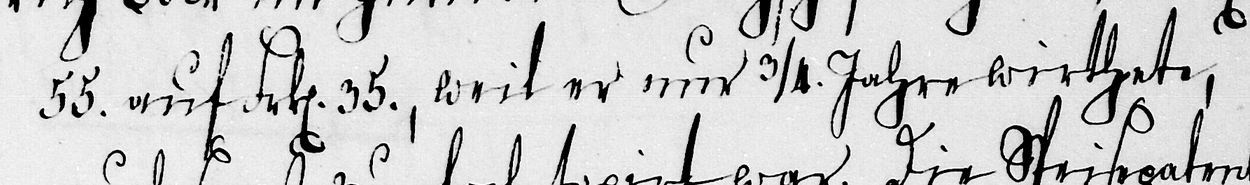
55. auf Frk[en]. 35., weil er nur 3/4. Jahre wirthete,
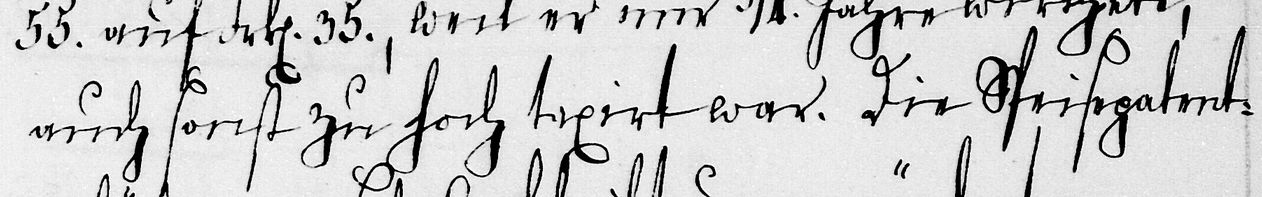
auch sonst zu hoch taxirt war. Die Speisepatent¬
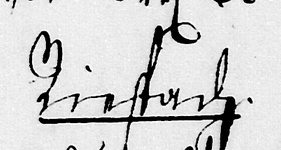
Riespach.
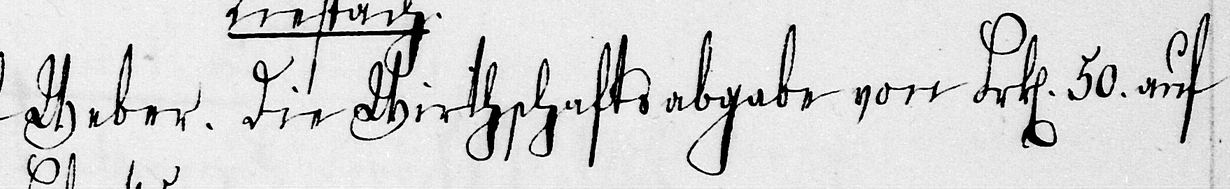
Weber. Die Wirthschaftsabgabe von Frk[en]. 50.
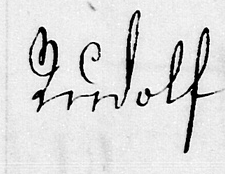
Rudolf
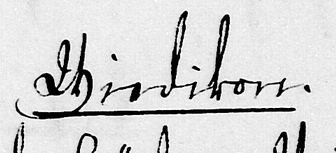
Wiedikon.
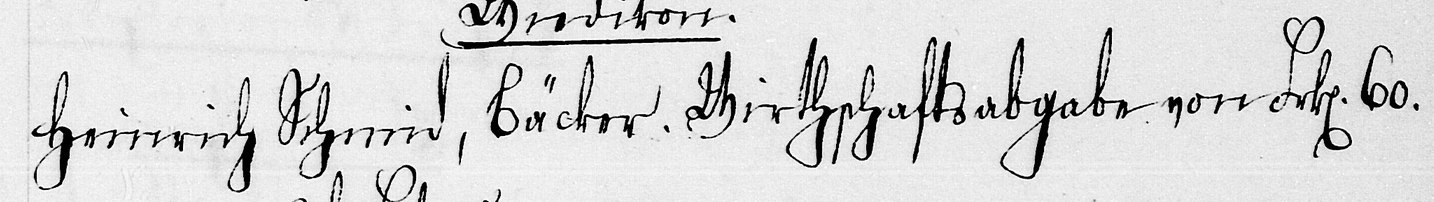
Heinrich Schmid, Bäcker. Wirthschaftsabgabe von Frk[en].
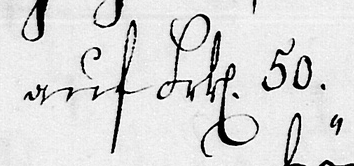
auf Frk[en].
